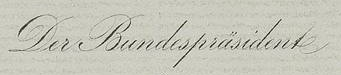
Der Bundespräsident
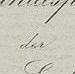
der
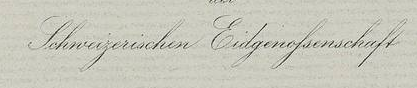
Schweizerischen Eidgenossenschaft
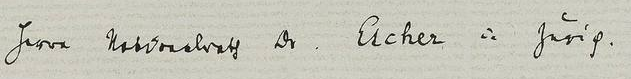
Herrn Nationalrath Dr. Escher in Zürich.
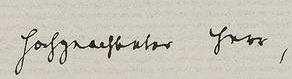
Hochgeachteter Herr,
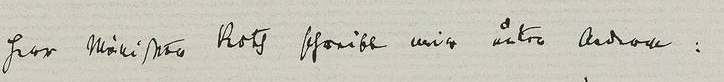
Herr Minister Roth schreibt mir unter Anderm:
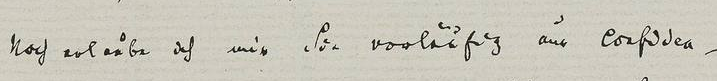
«Noch erlaube ich mir Sie vorläufig um confiden-
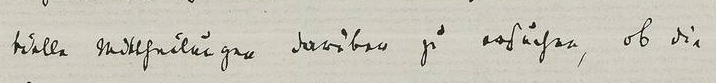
tielle Mittheilungen darüber zu ersuchen, ob die
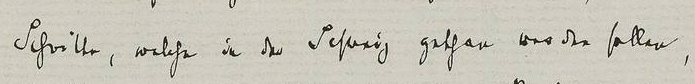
Schritte, welche in der Schweiz gethan werden sollen,
